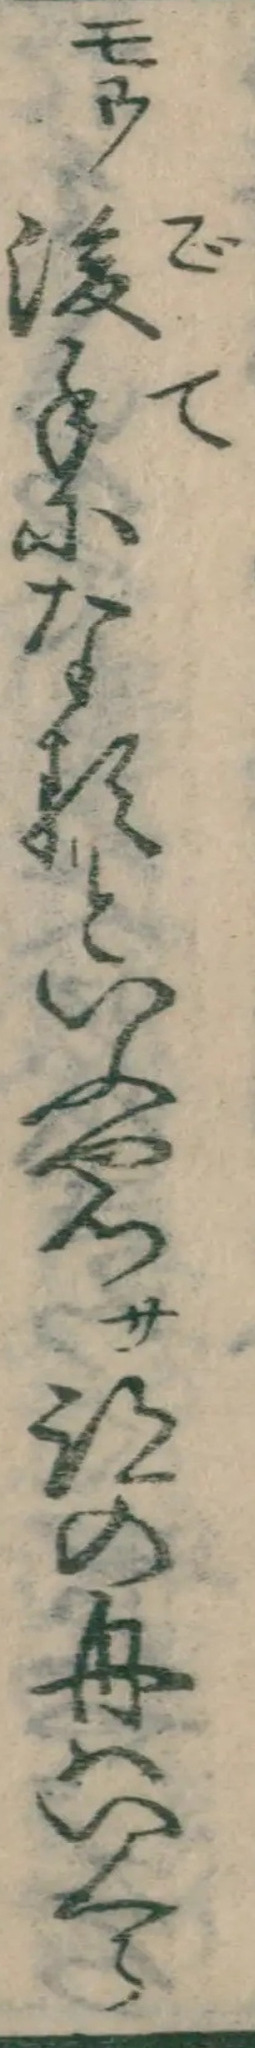モウ後手になるといふやつサ跡の舟はいくら

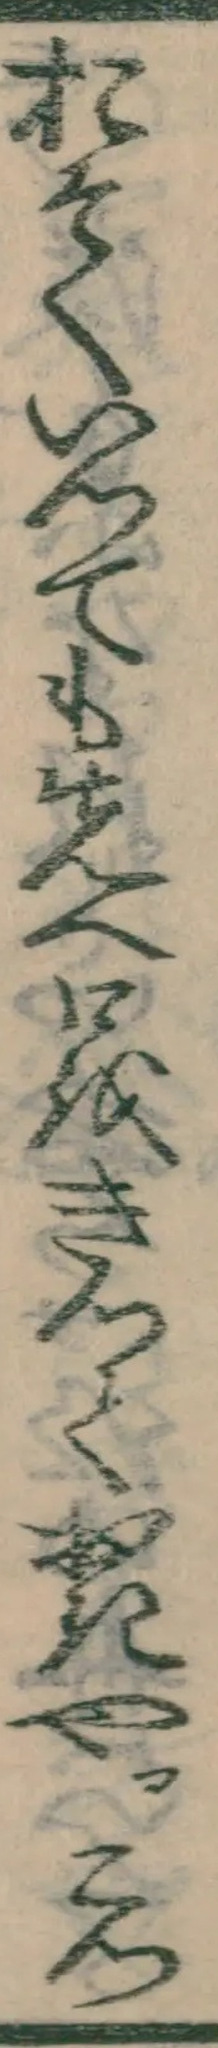おそくいつても先へ口をきつておきやァこつ
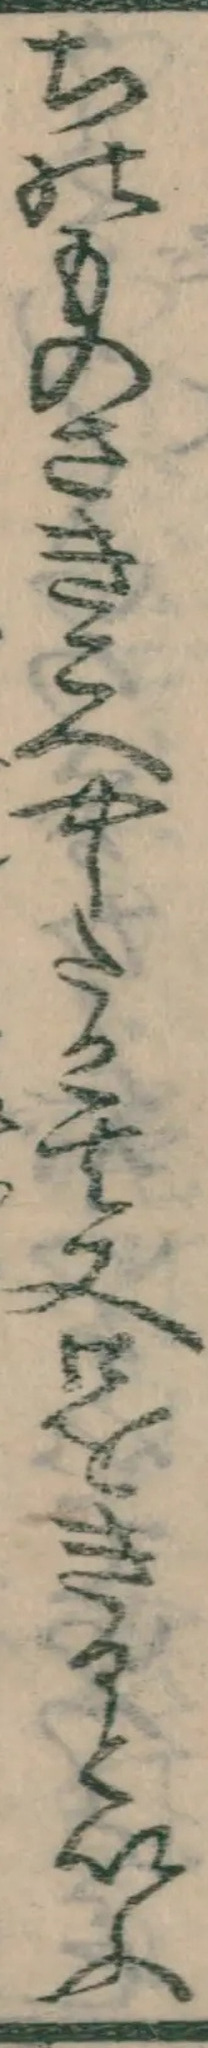ちのものさきこへやしたか其又口をきるといふ
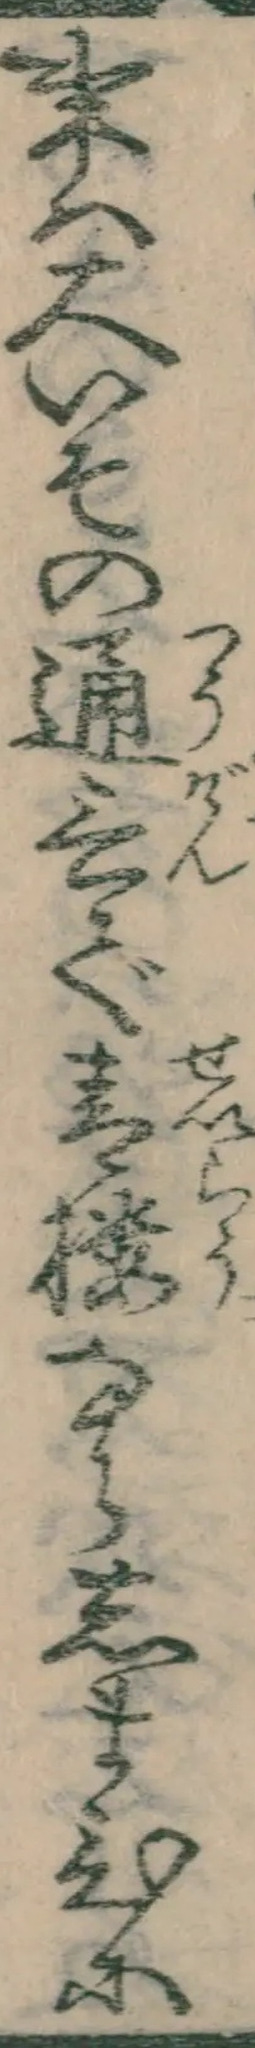事は大いその通言で青楼ならしまひに
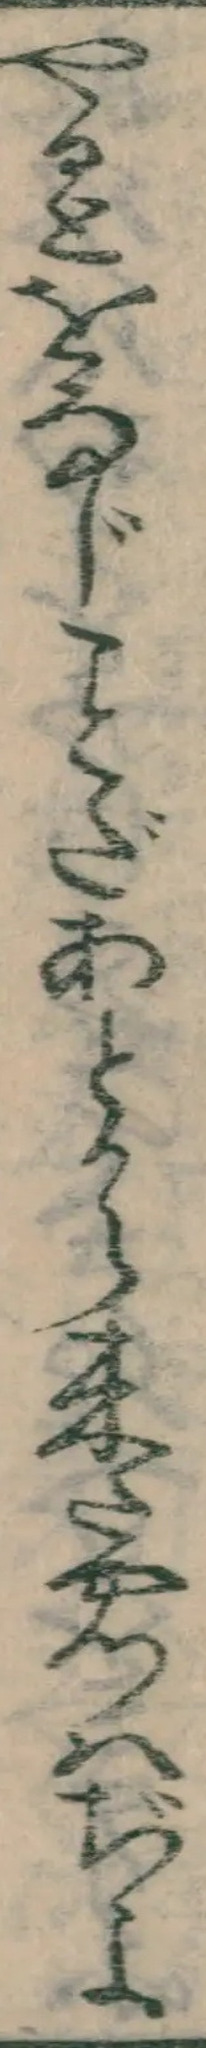やるとをなじことだあとから来たやつはぢよ
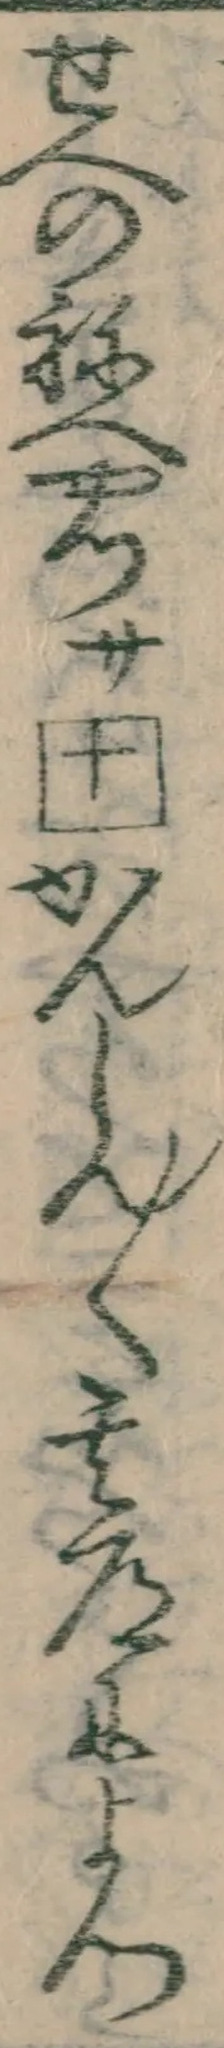せへのねへやつサ〈十〉かんしん〳〵其道によつ
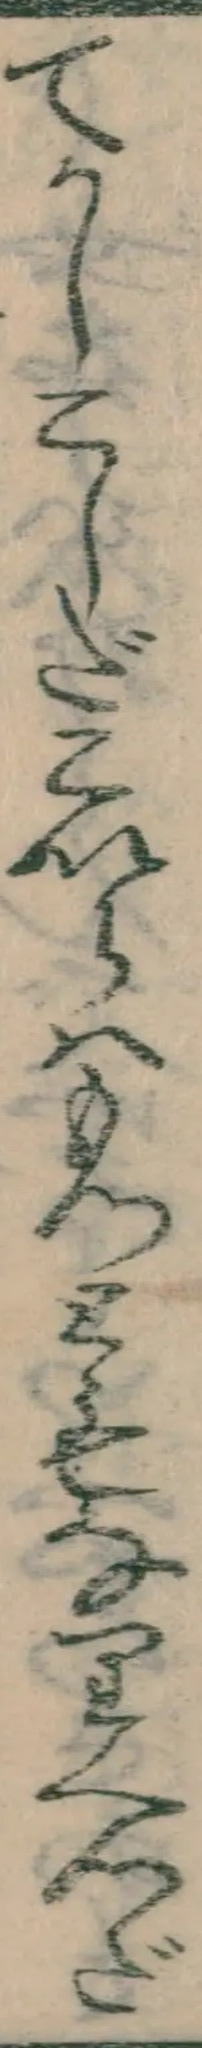てかしこしだこいらはものともなりくつだ
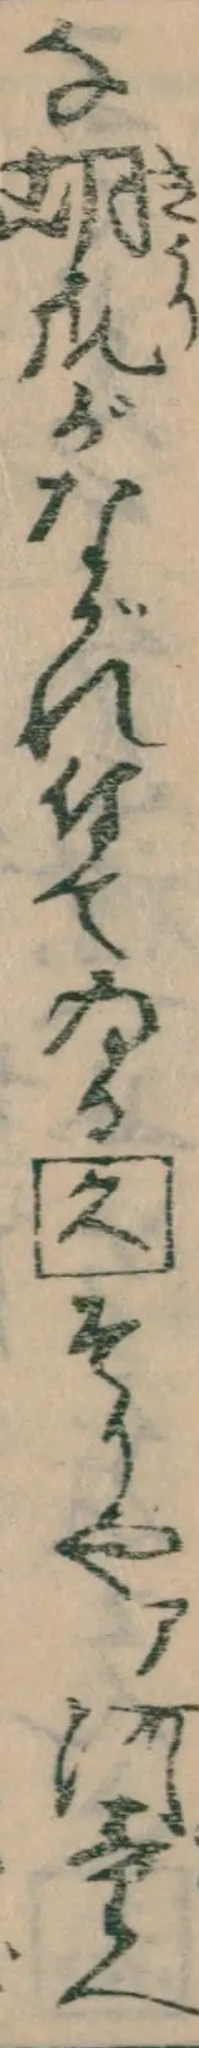な胡瓜がながれ付てゐる〈久〉そりやァ河童へ
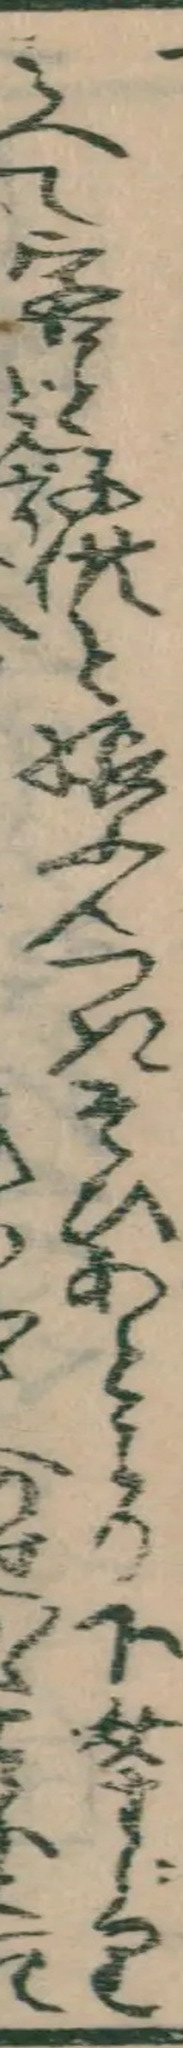みへて客と子供と娘ふんつきそひあとより下女すゞり
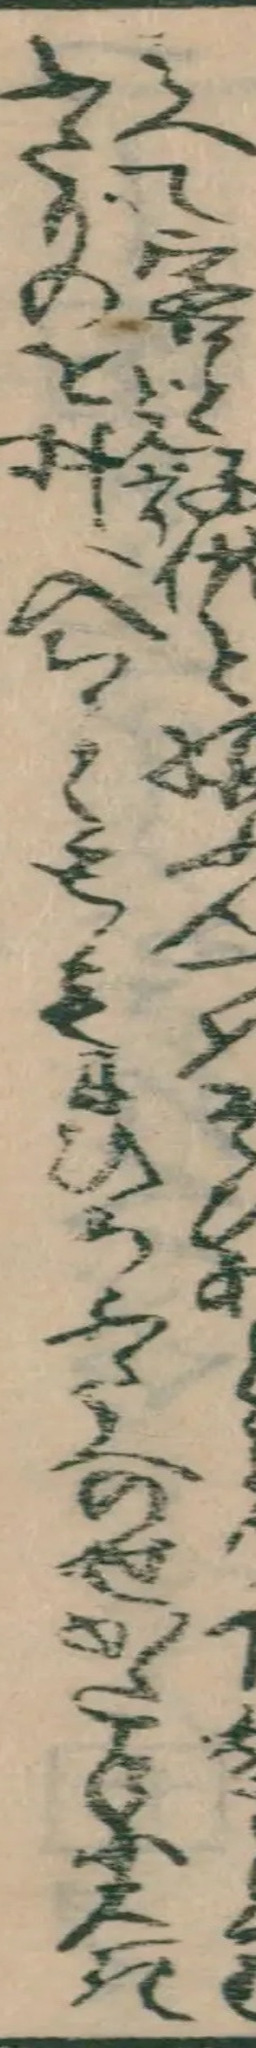ふたものを丼へ入ちよくとともにひろふたへのせかた手に大き
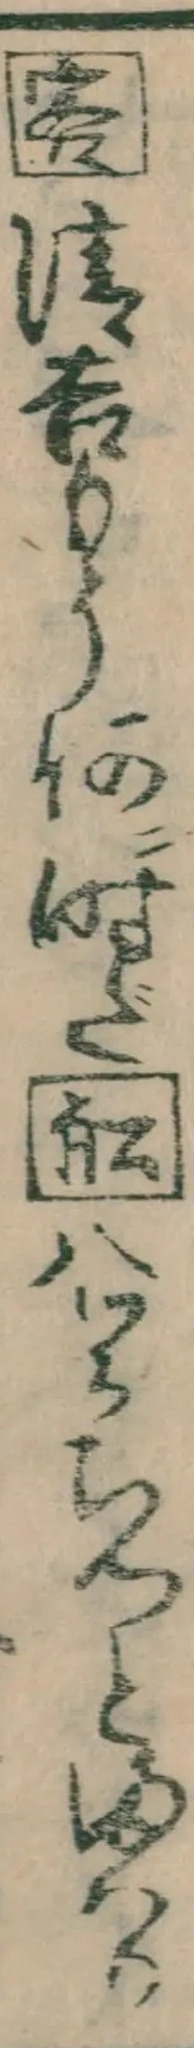〈客〉清吉もう何に時だ〈船〉八ツちつとまはり

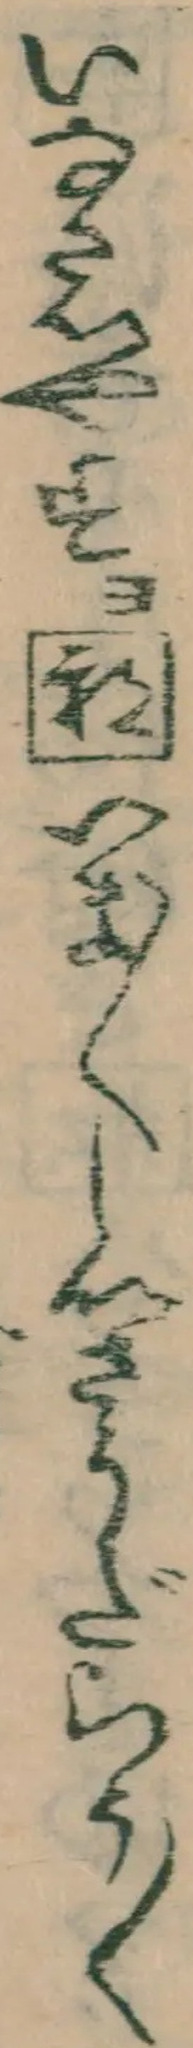いなさいやすヨ〈朝〉いま〳〵しいさうだらう〳〵
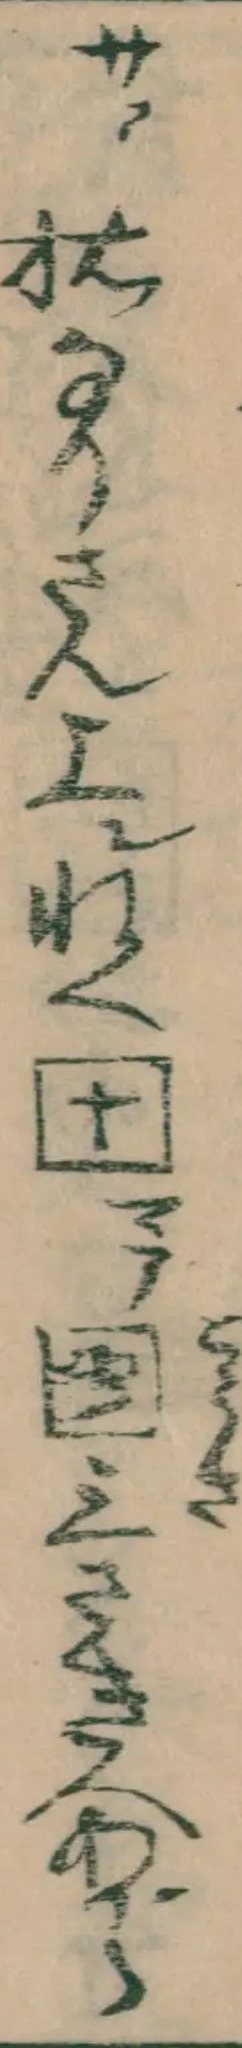サァ祐なりさん上んねへ〈十〉マア団三さきへあがら
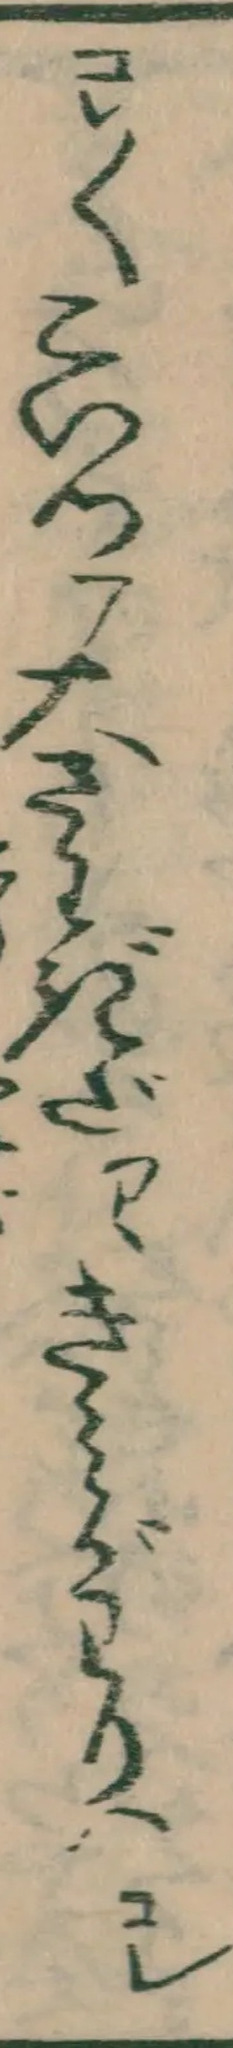コレ〳〵こいつァ大さわぎだアヽきみがわりいコレ
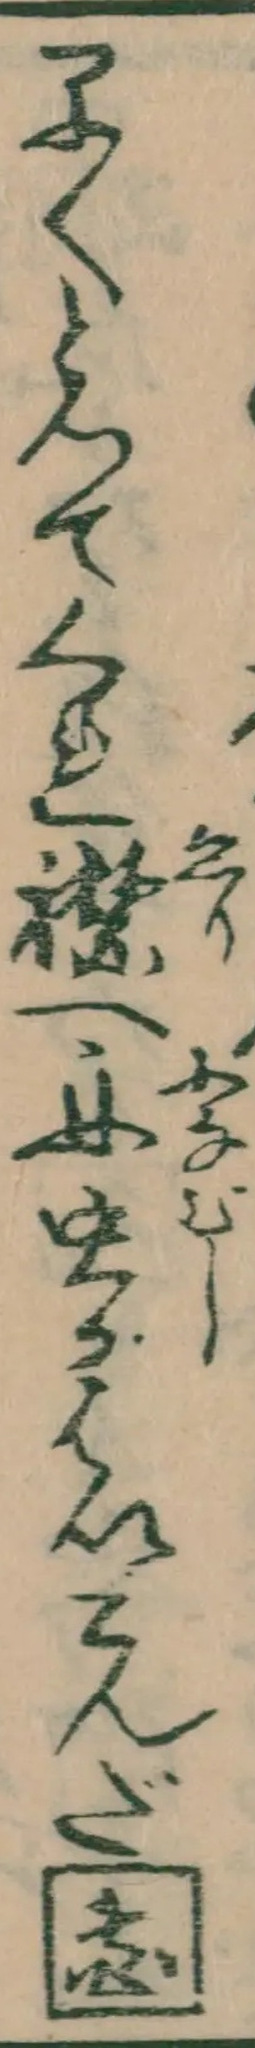早くとつてくれ襟へ舟虫かはいこんだ〈団〉
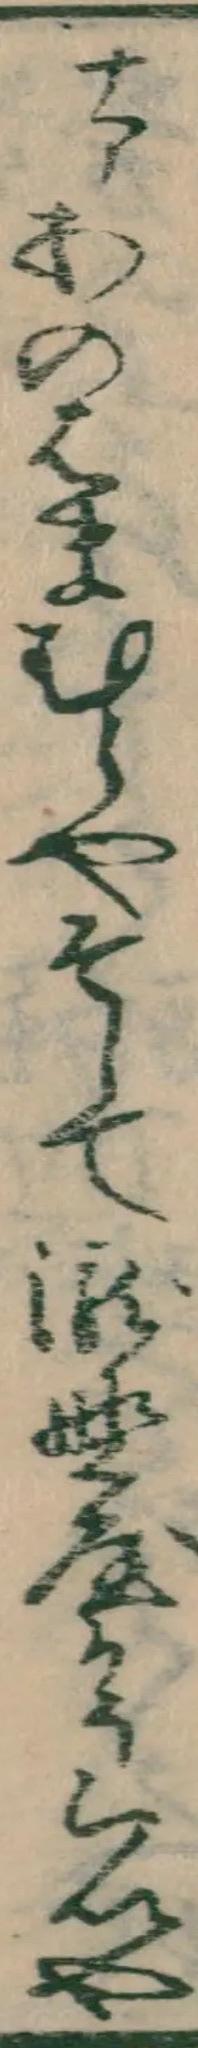ナアあのはまむらやそして瀧野屋かうらいや
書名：教訓読本：大礒風俗仕懸文庫
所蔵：国立国会図書館 National Diet Library, JAPAN
